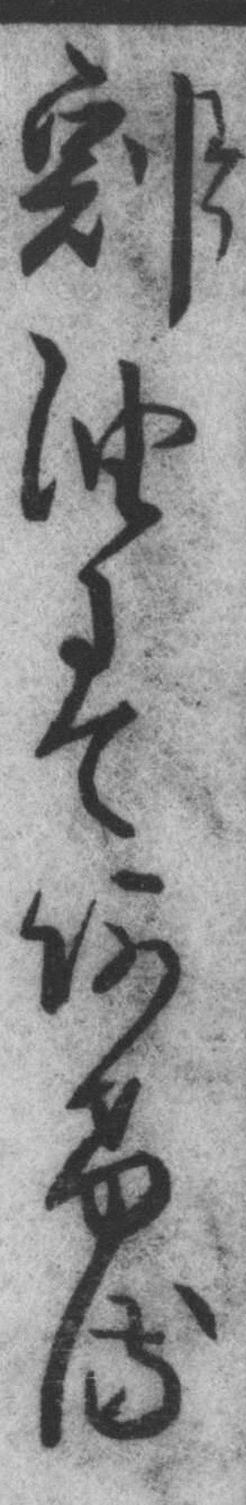割油にてあける
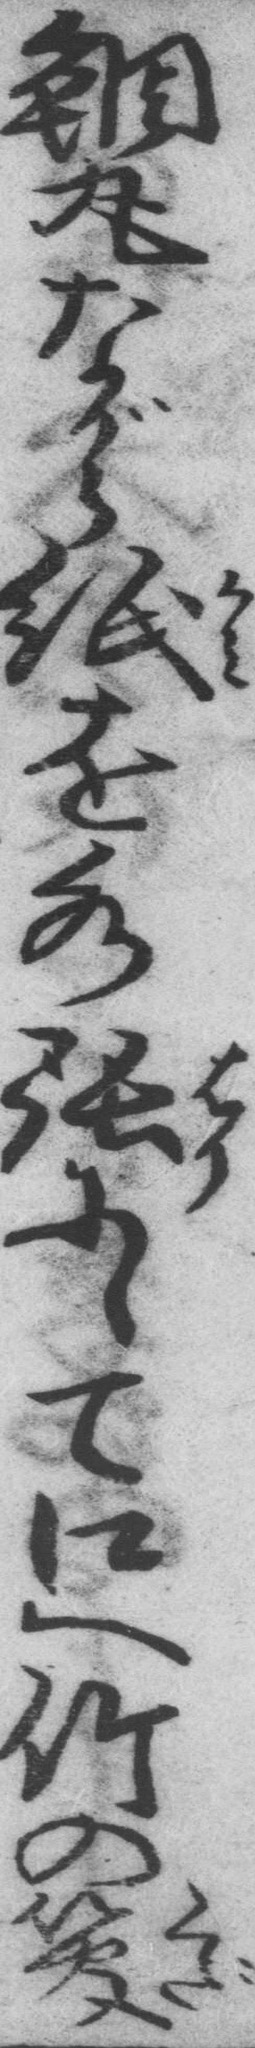鯛丸ながら紙を水張にして口へ竹の管
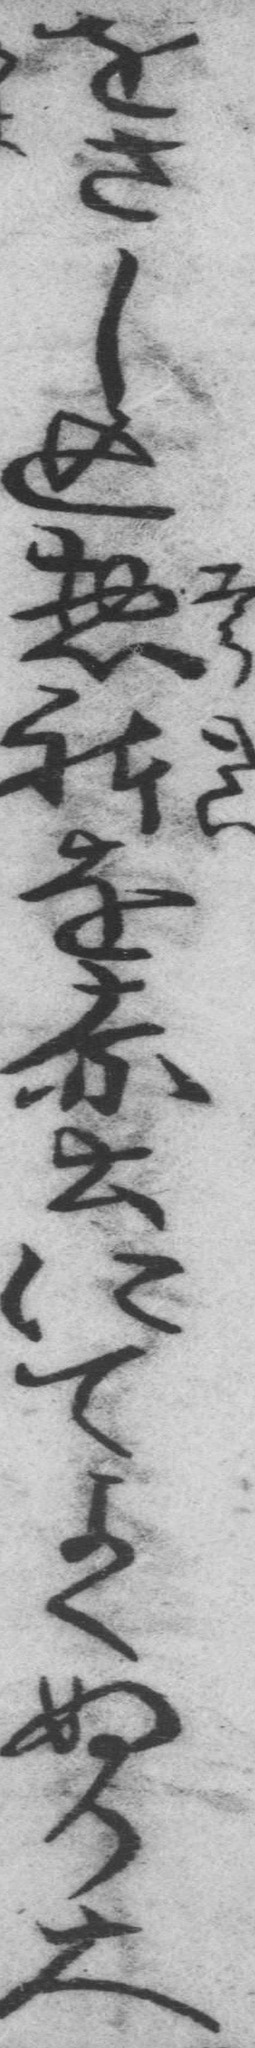をさし込総体を赤土にてよくぬり大
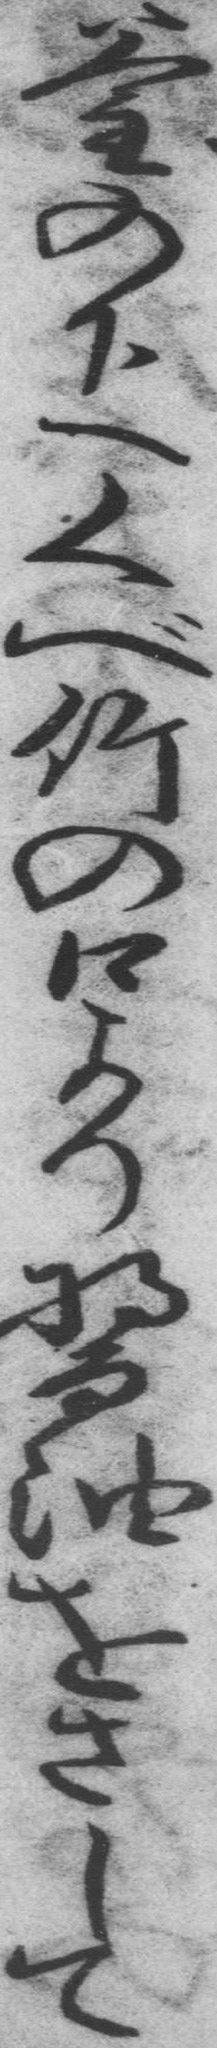釜の下へくべ竹の口より醤油をさして
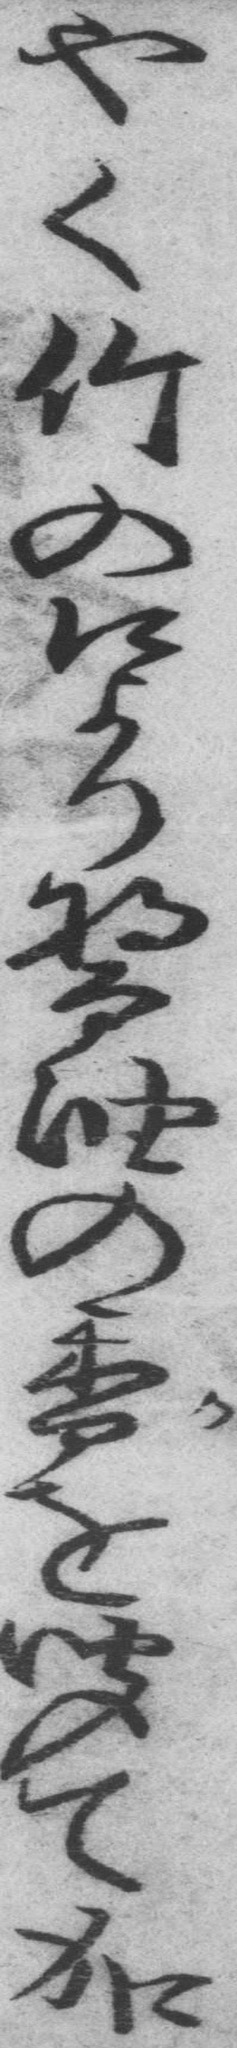やく竹の口より醤油の香を聞て加
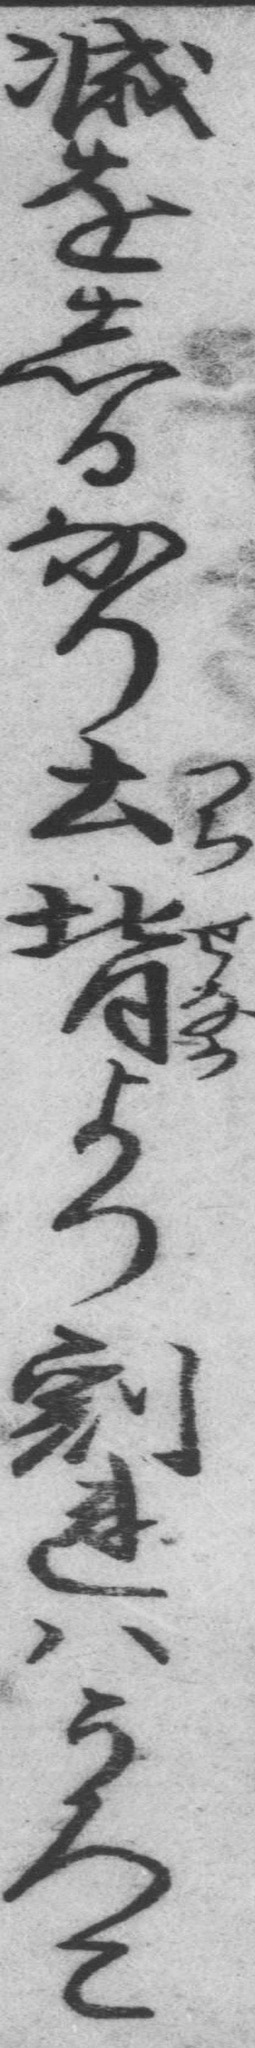減をしるなり土背より割れはうろこ
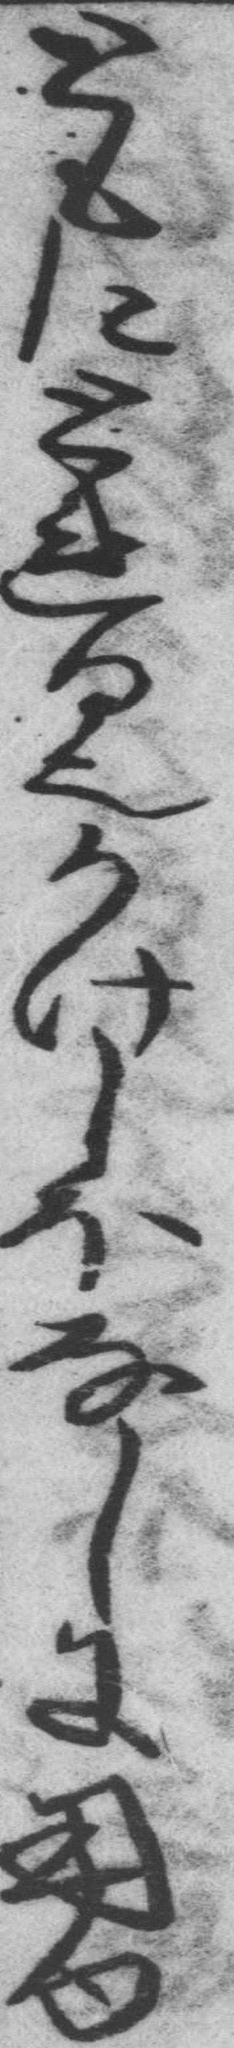ともにとれる也かけしほなしに用ゆ
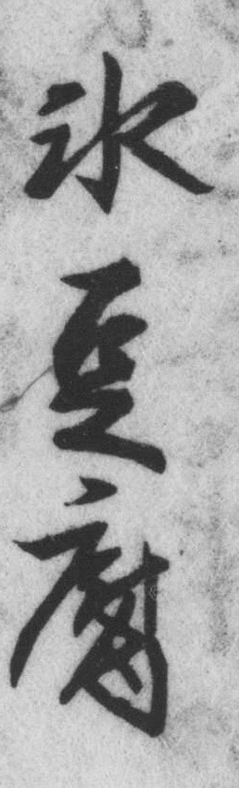氷豆腐
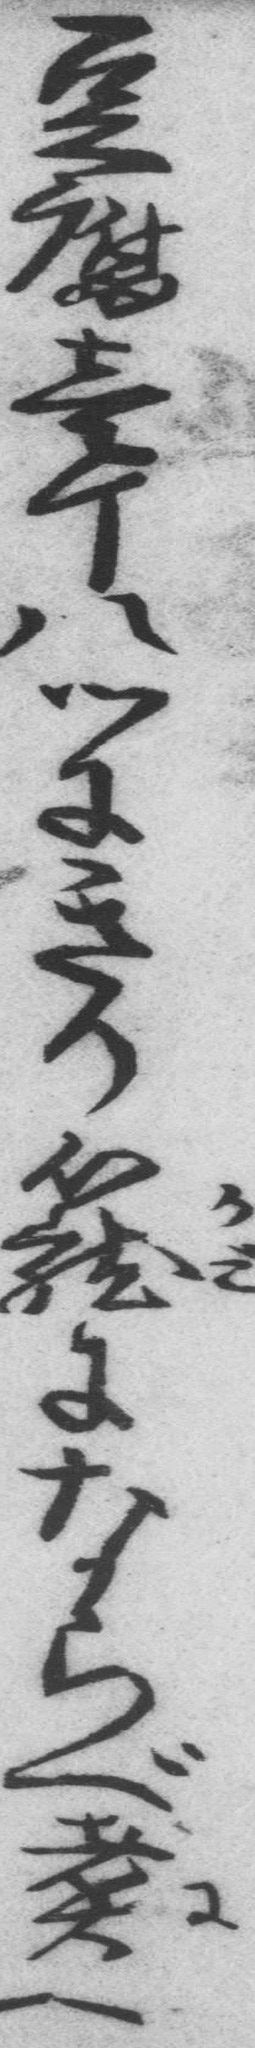豆腐壱丁八ツにきり籠にならべ煮へ
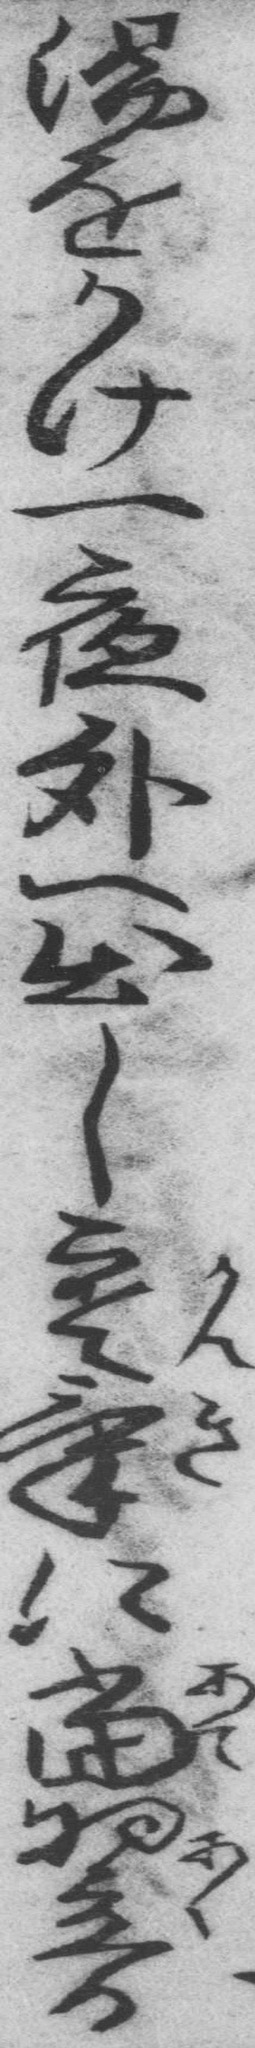湯をかけ一夜外へ出し寒気に当翌る
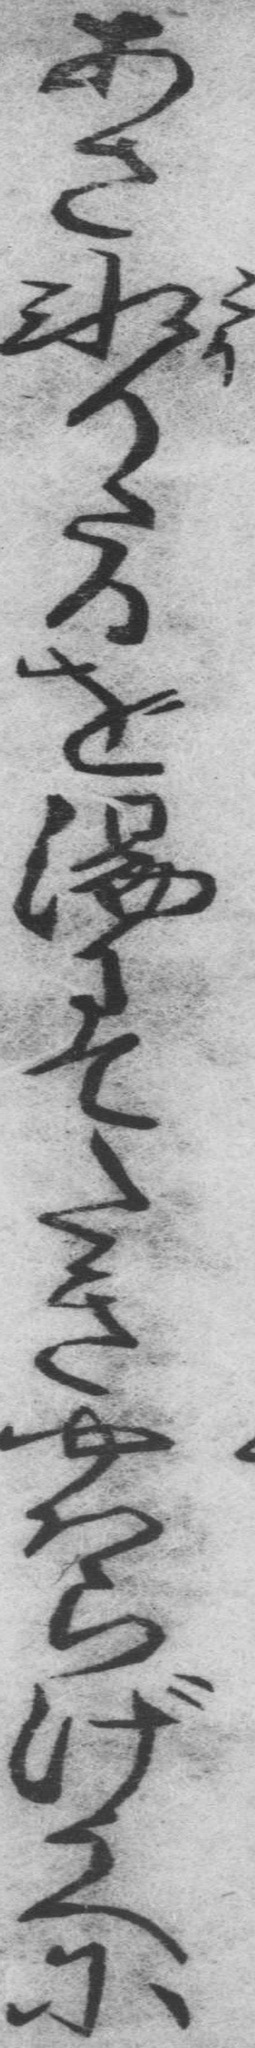あさ氷りたるを湯にてたきやはらげうへに
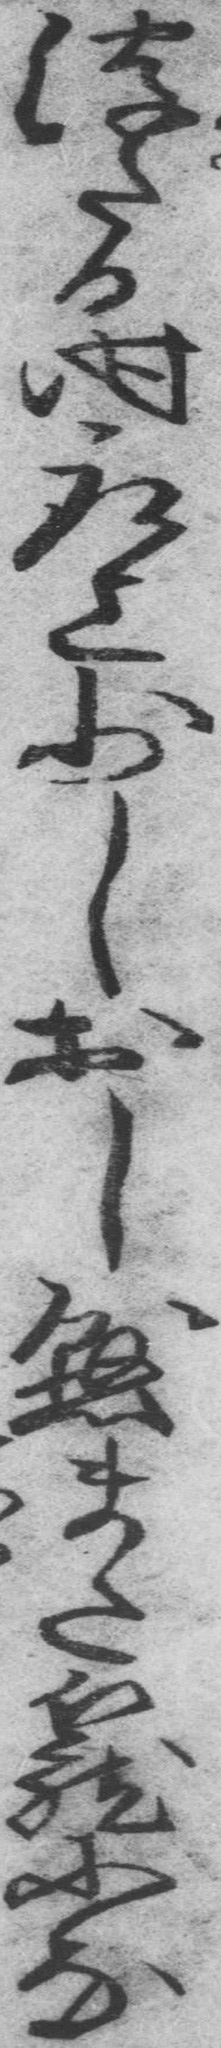浮たる時取上少しおし懸また籠にな
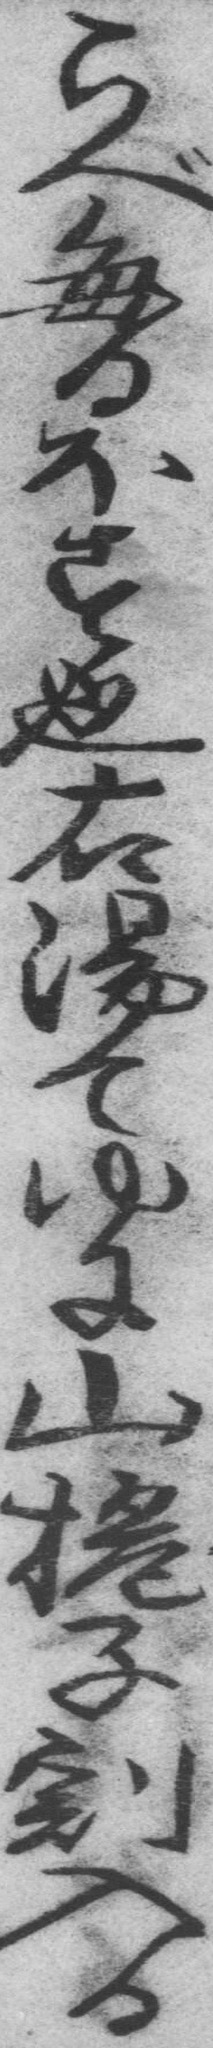らべ毎日ほす也右湯てゆに山梔子割入る
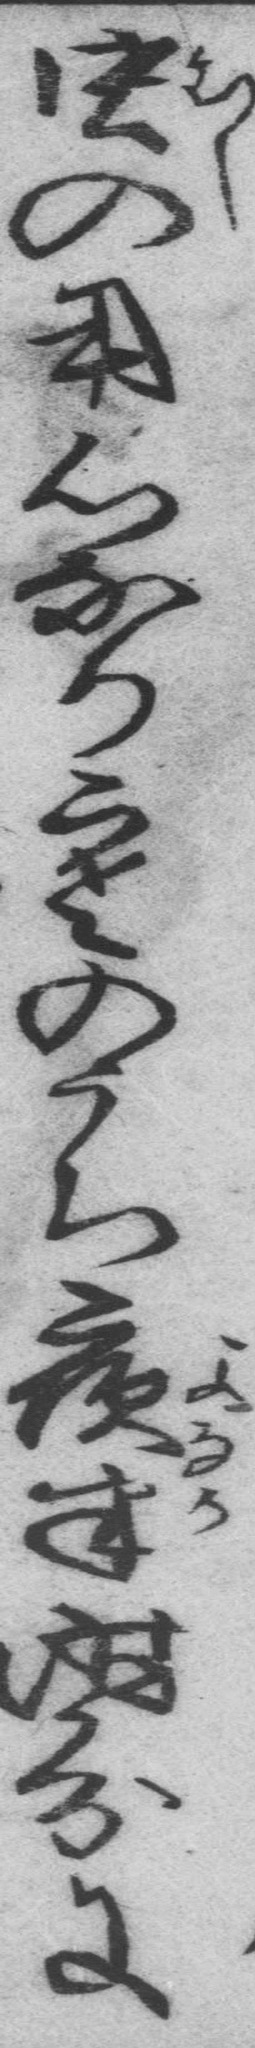虫の用心なり寒のうち夜半時分に
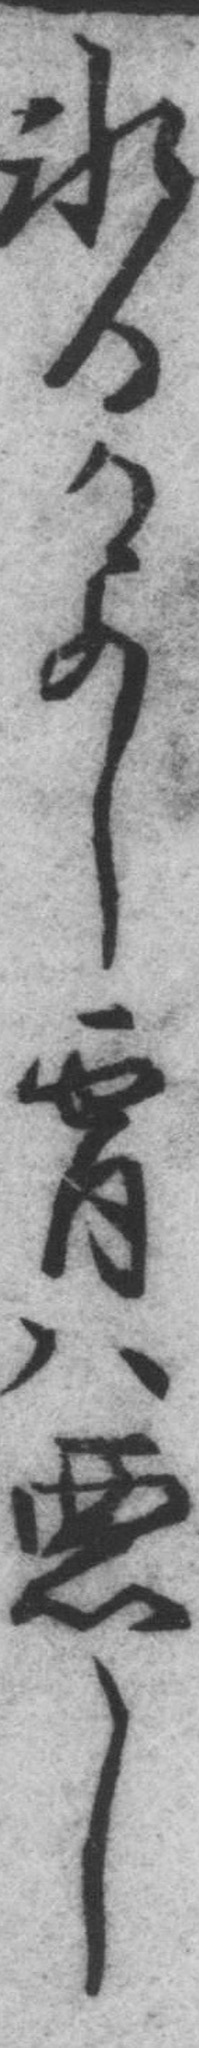氷るかよし宵は悪し

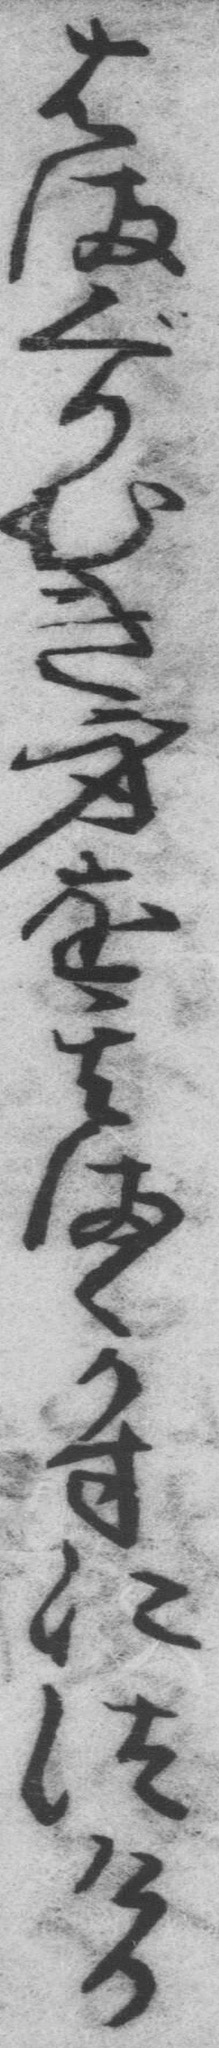はまぐりむき身を其まゝかすにつける
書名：料理山海郷
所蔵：大阪府立大学学術情報センター 国文学研究資料館
